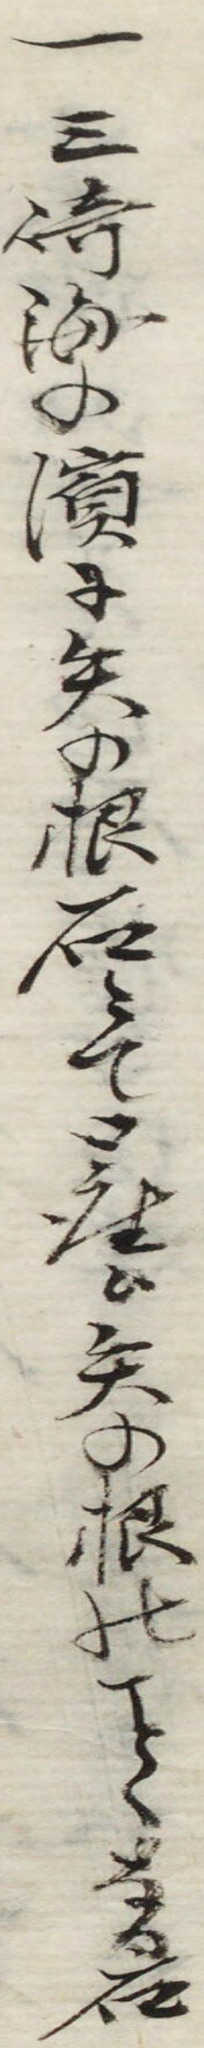一三崎海の浜に矢の根石とて御座候矢の根のことくなる石
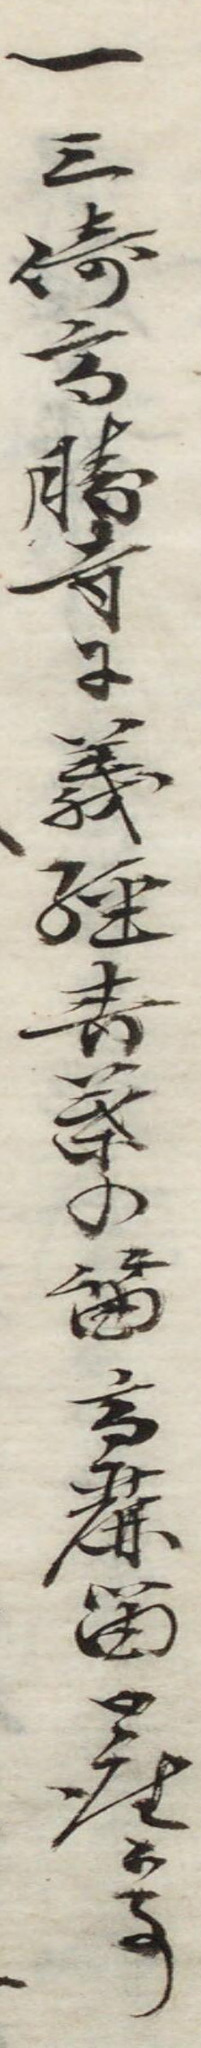一三崎高勝寺に義経青葉の笛高麗笛御座候事
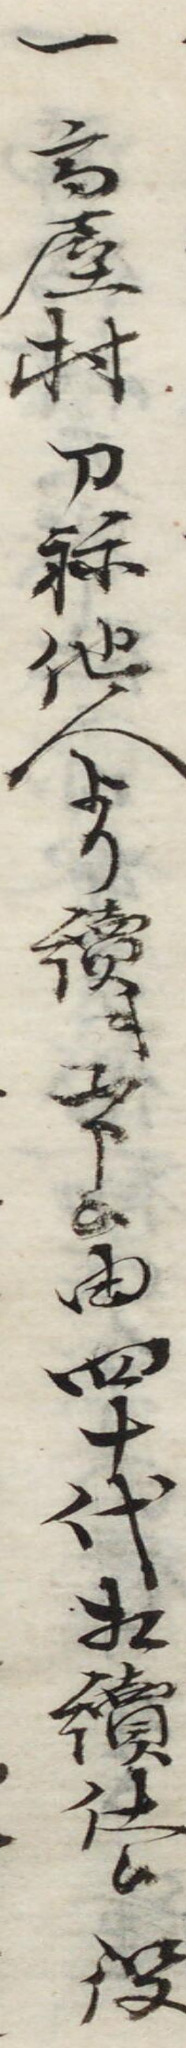一高屋村刀祢他人より続き不申候由四十代相続仕候役
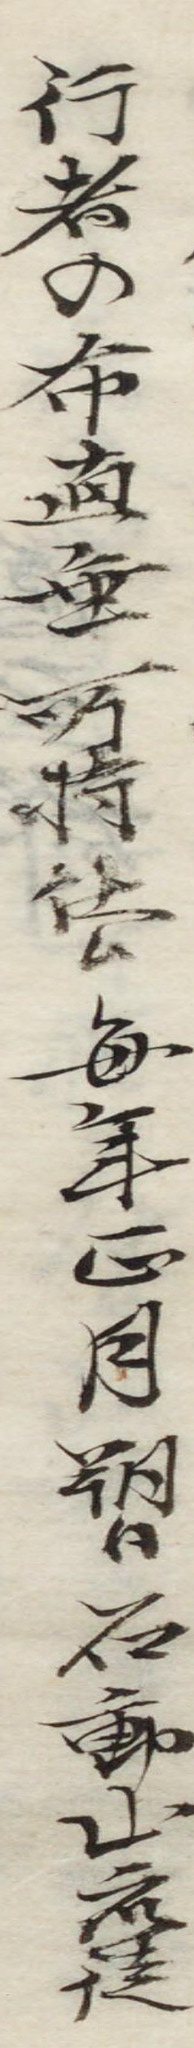行者の布直垂所持仕候毎年正月朔日石動山衆徒
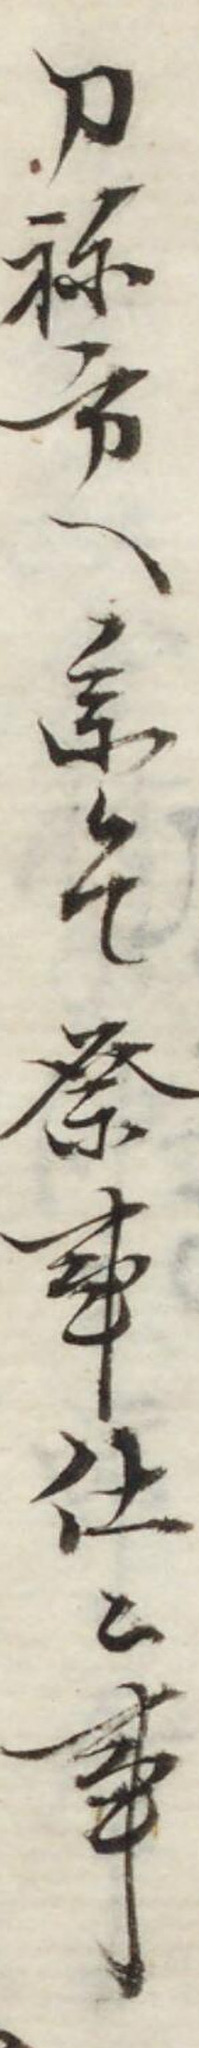刀祢方へ参候て祭事仕候事
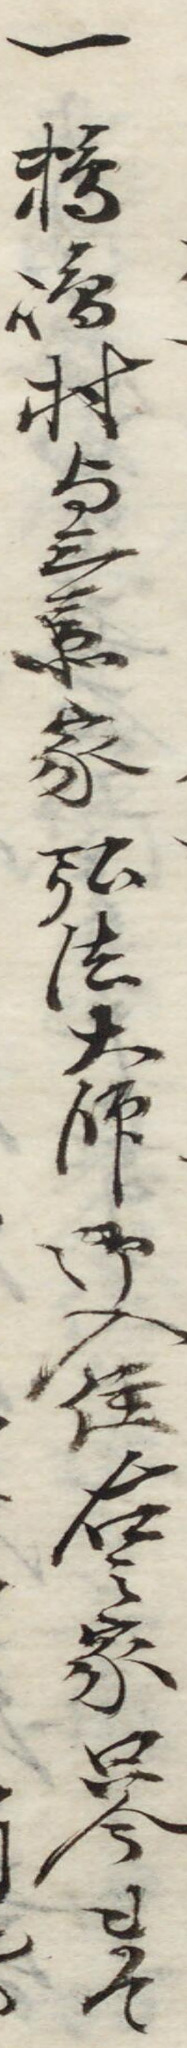一鵜嶋村与三兵衛家弘法大師御入住右之家只今まて
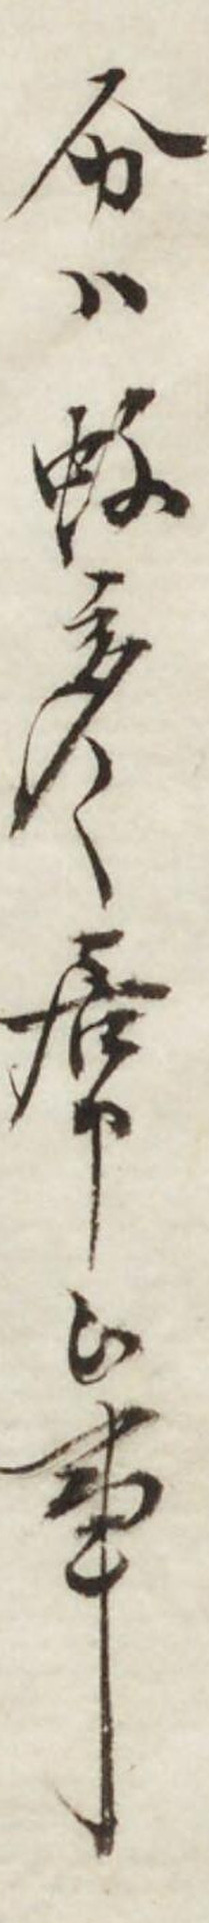分は蚊多く居申候事
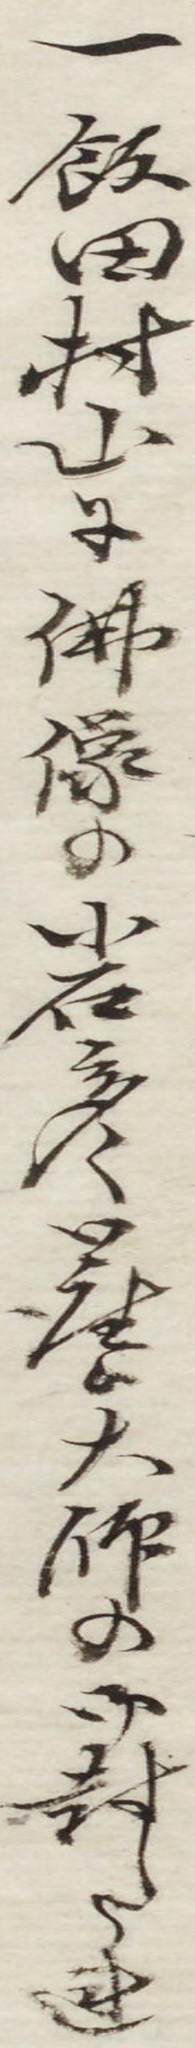一飯田村山に仏像の小石多く御座候大師の御封たれ
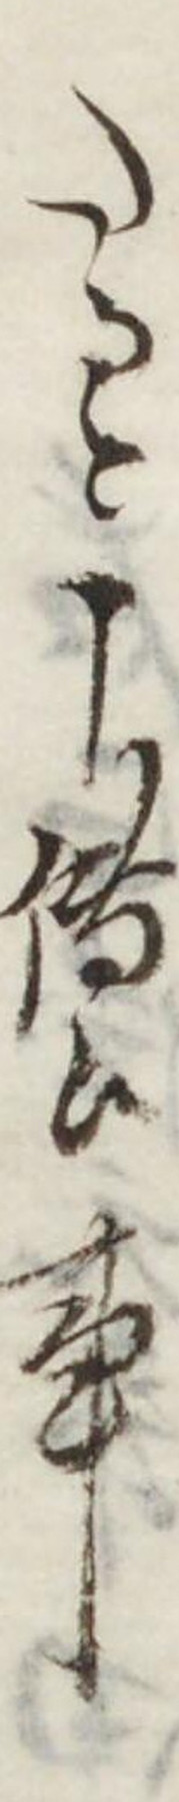たるを申侍候事
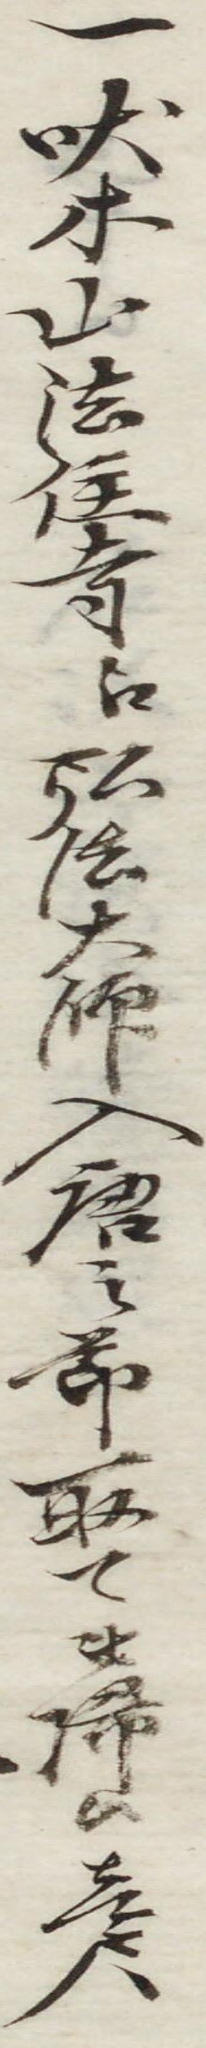一吠木山法住寺え弘法大師入唐之節取て被帰候壱尺
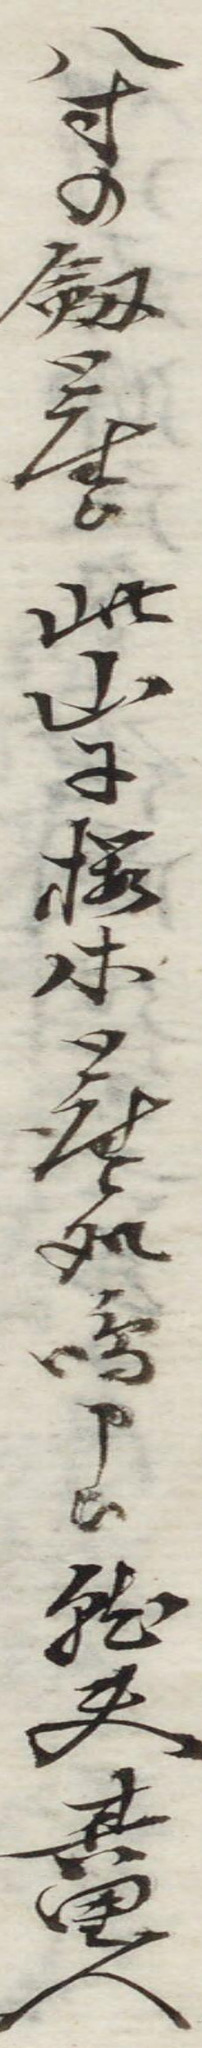八寸の釼御座候此山に桜木御座候処鳴申候就夫其里人
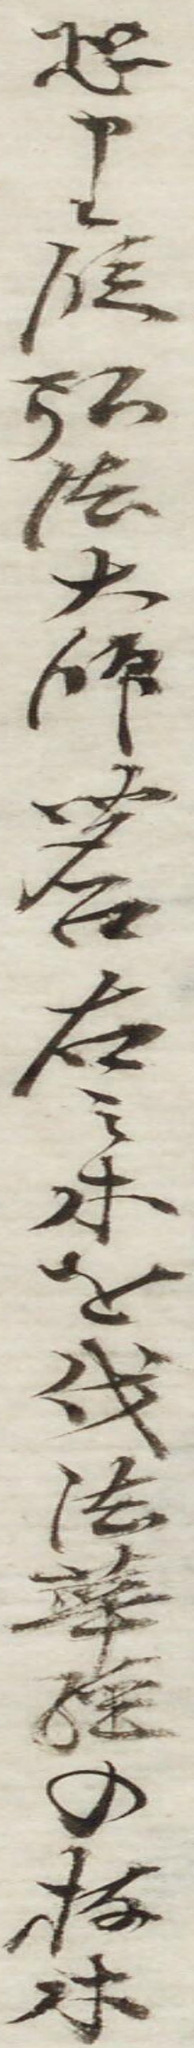恐申候段弘法大師聞召右之木を伐法華経の板木
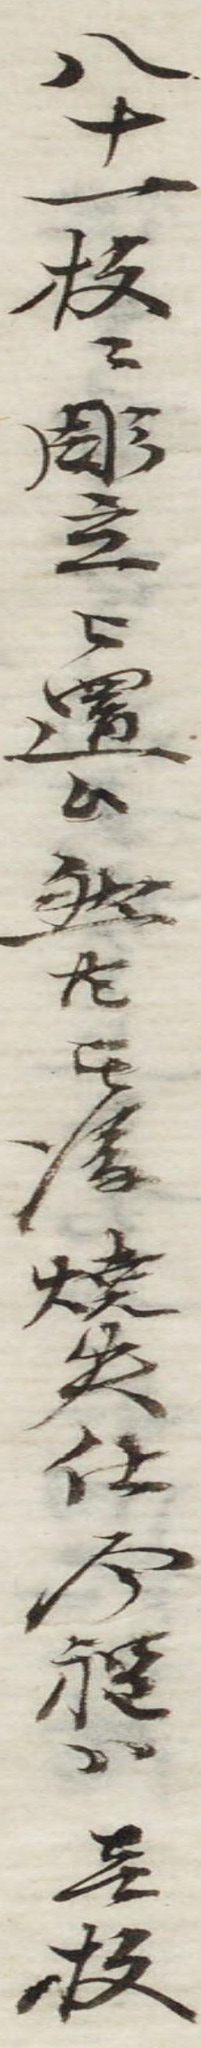八十一枚に彫立被置候然共其後焼失仕今程は壱枚
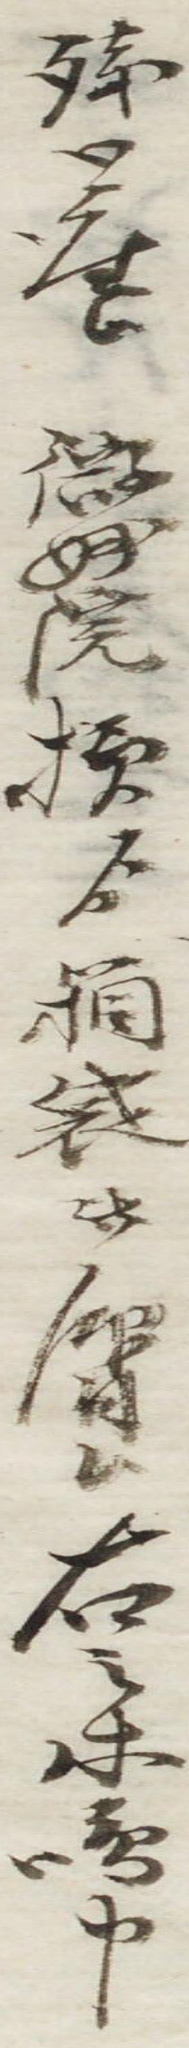残御座候微妙院様ゟ箱袋被仰付候右之木鳴申
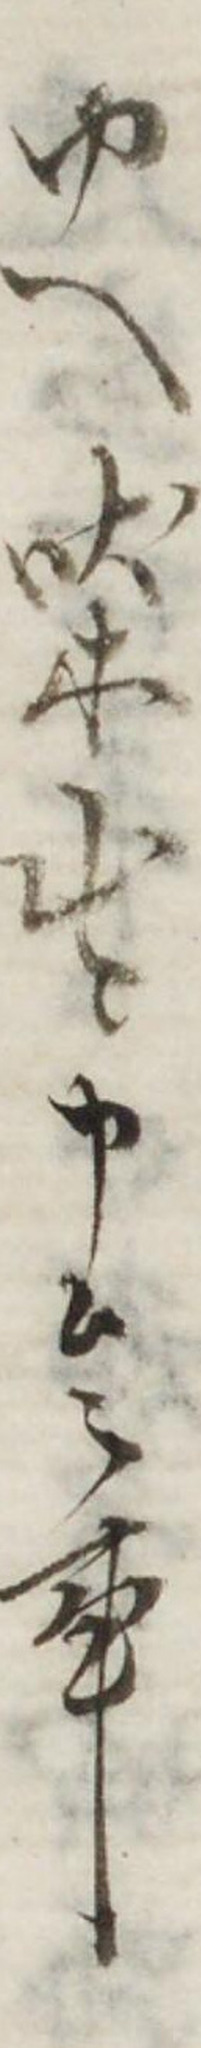ゆへ吠木山と申候之事
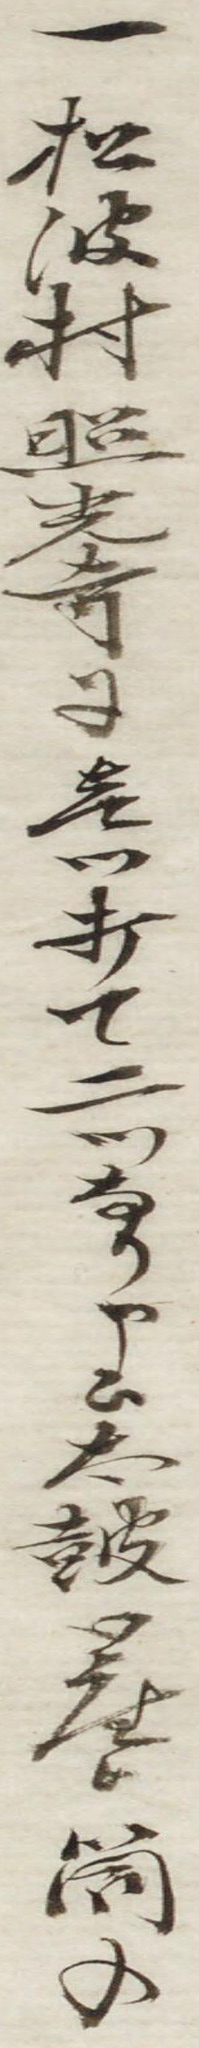一松波村照光寺に壱ッ打て二ッなり申候太鼓御座候筒の
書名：古老旧聞紀略
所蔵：Ishikawa Prefectural Library
